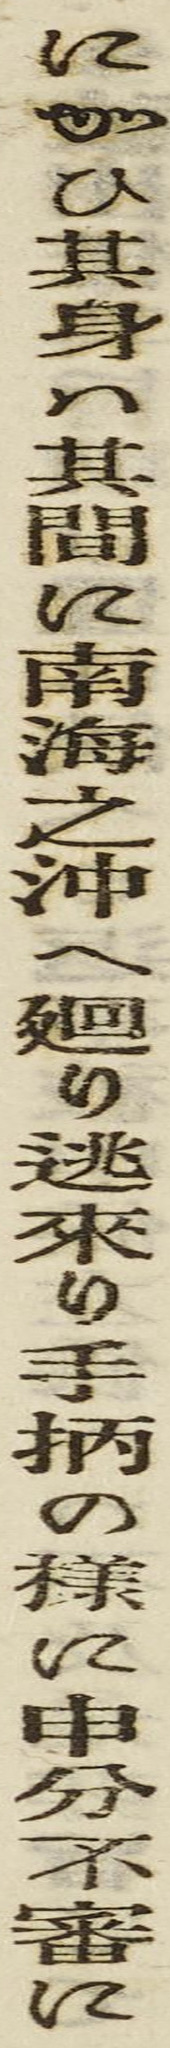にかひ其身ハ其間に南海之沖へ廻り逃来り手柄の様に申分不審に
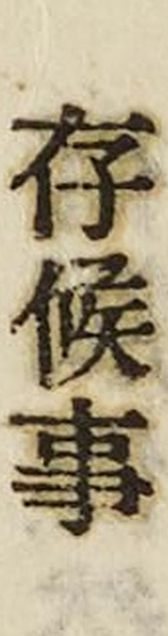存候事
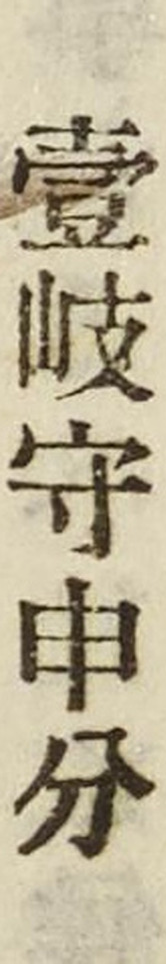壱岐守申分
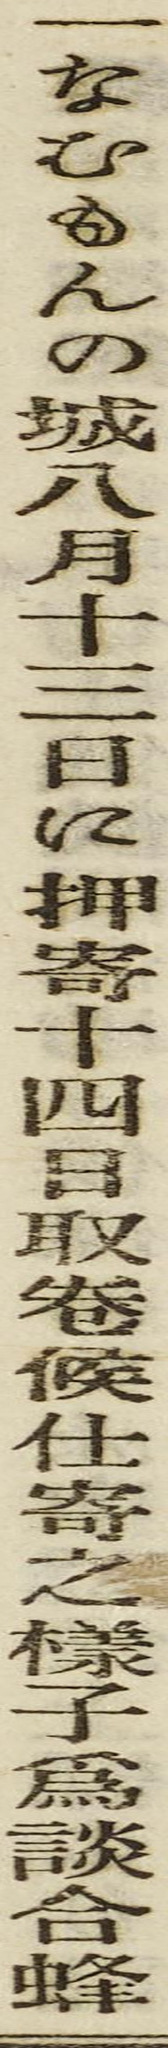一なむもんの城八月十三日に押寄十四日取巻候仕寄之様子為談合蜂
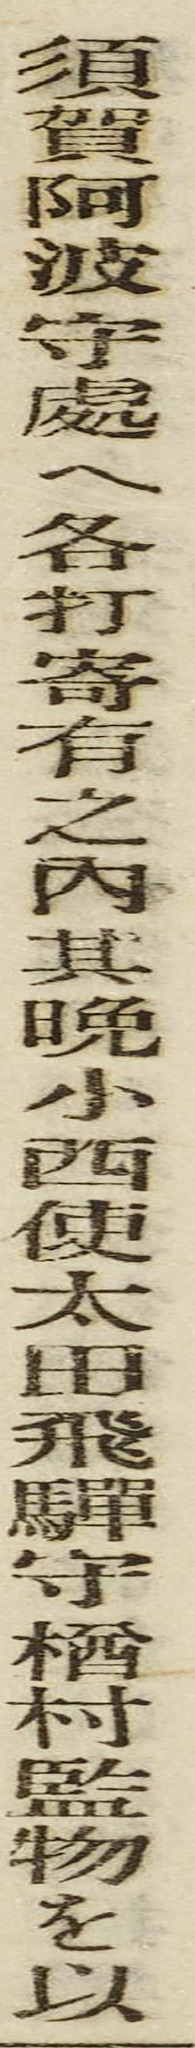須賀阿波守処へ各打寄有之内其晩小西使太田飛騨守楢村監物を以

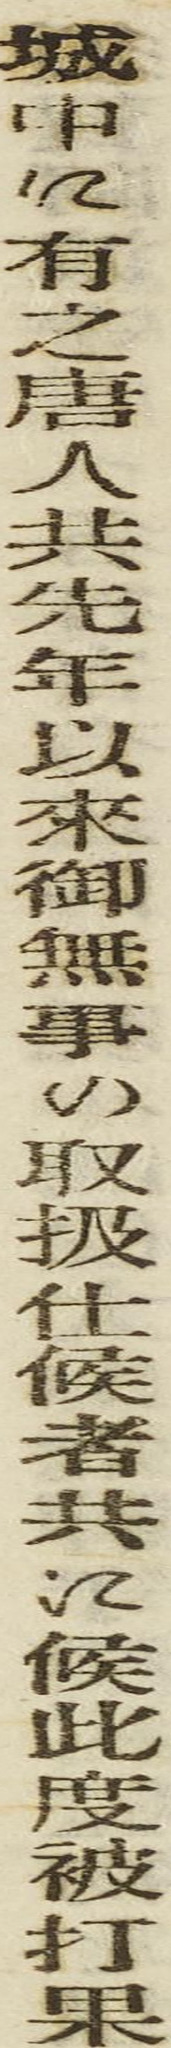城中に有之唐人共先年以来御無事の取扱仕候者共に候此度被打果
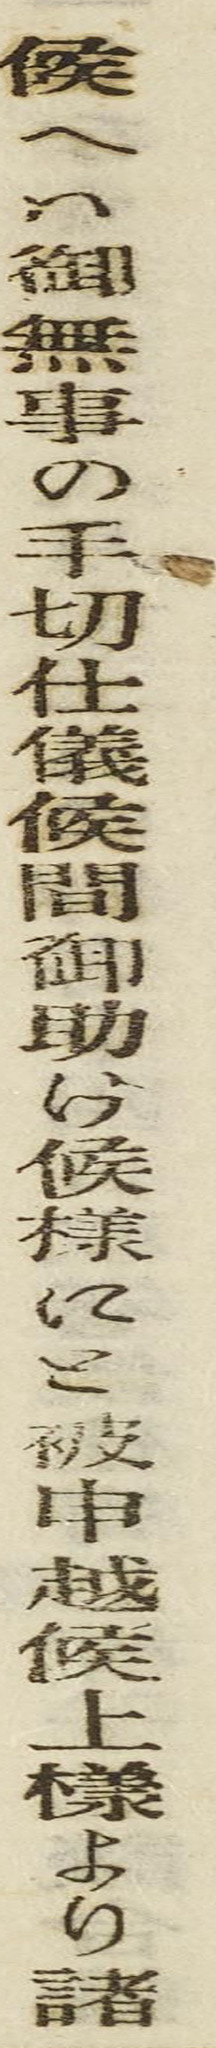候へハ御無事の手切仕儀候間御助け候様にと被申越候上様より諸
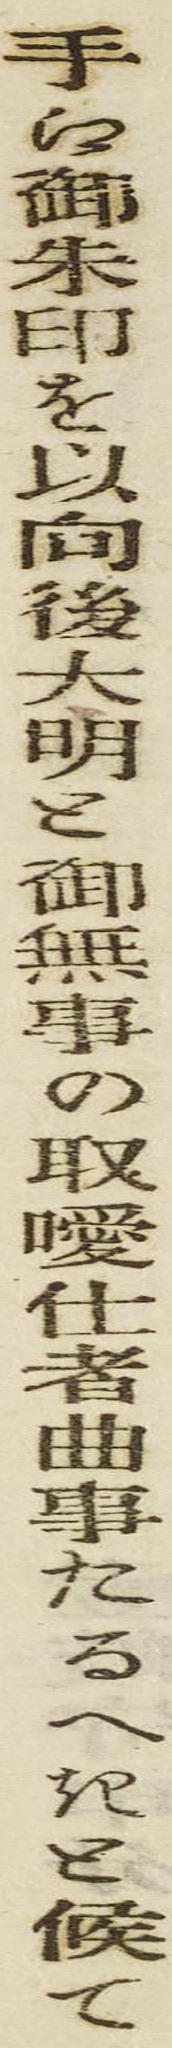手え御朱印を以向後大明と御無事の取噯仕者曲事たるへきと候て
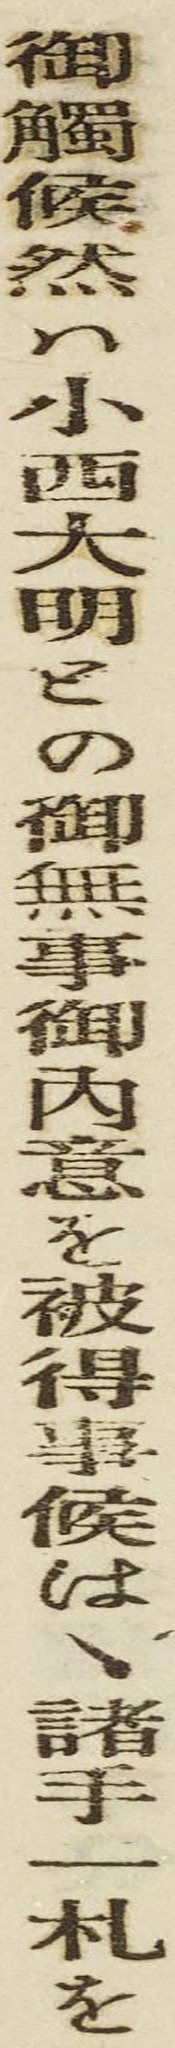御触候然ハ小西大明との御無事御内意を被得事候はゝ諸手一札を
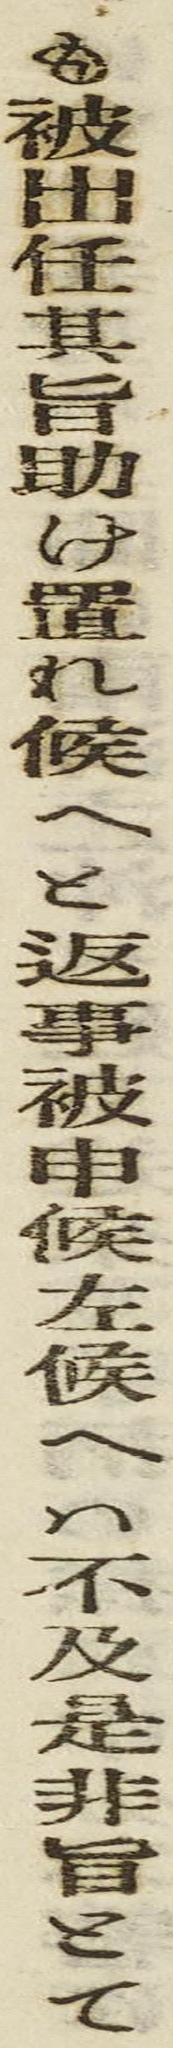も被出任其旨助け置れ候へと返事被申候左候へハ不及是非旨とて
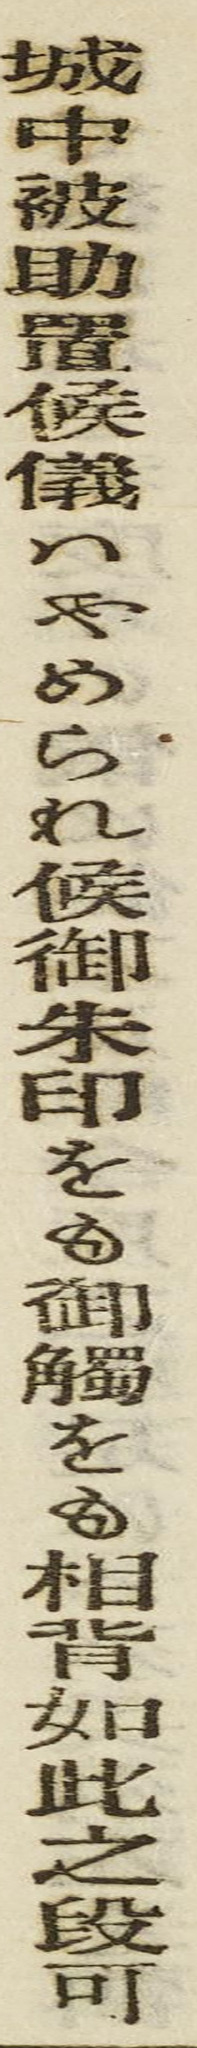城中被助置候儀ハやめられ候御朱印をも御触をも相背如此之段可
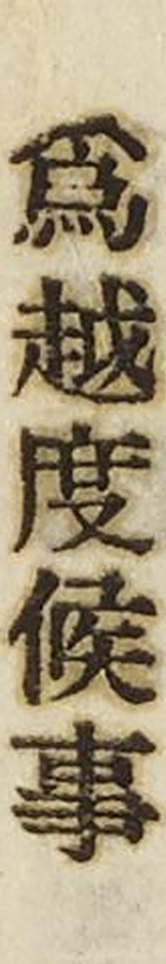為越度候事
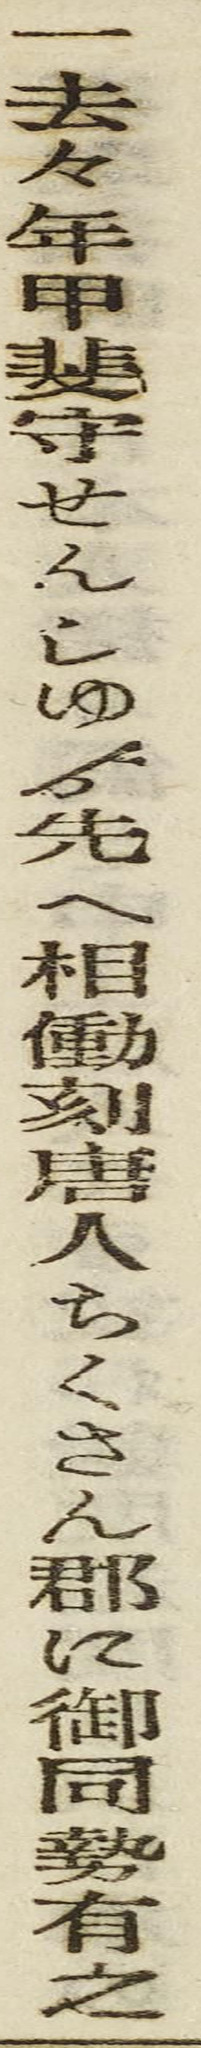一去々年甲斐守せんしゆゟ先へ相働刻唐人ちくさん郡に御同勢有之
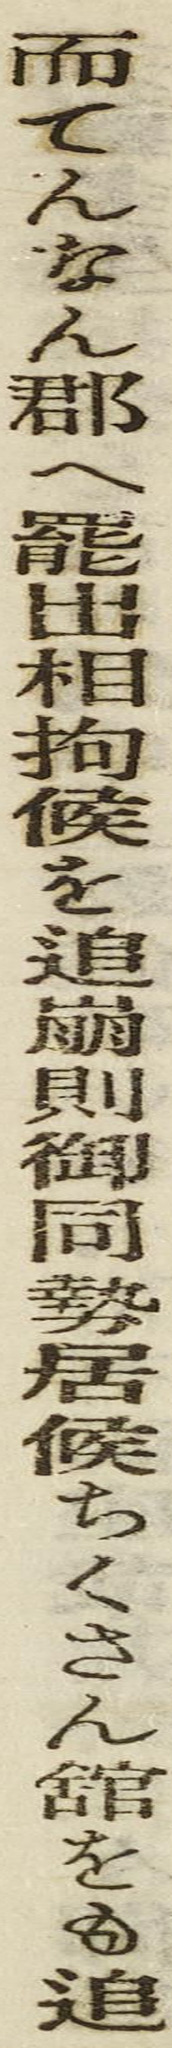而てんなん郡へ罷出相拘候を追崩則御同勢居候ちくさん舘をも追
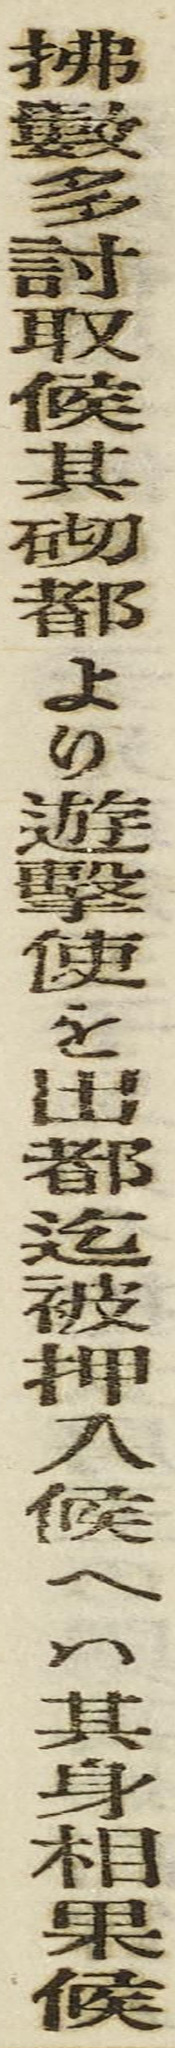払数多討取候其砌都より遊撃使を出都迄被押入候へハ其身相果候
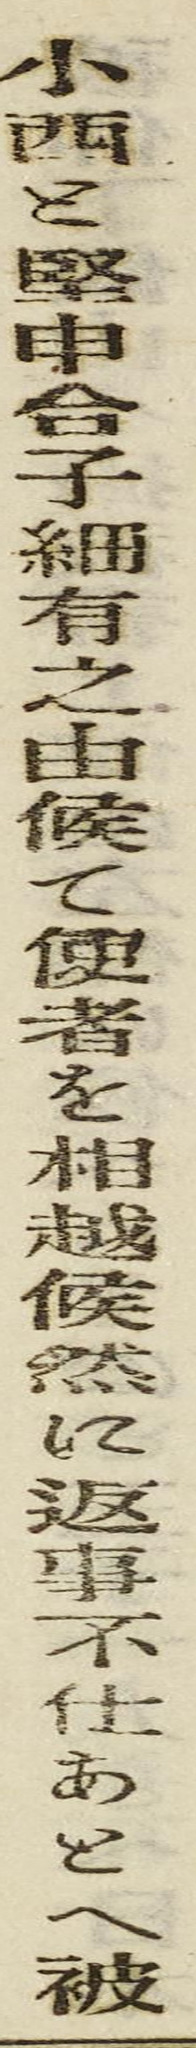小西と堅申合子細有之由候て使者を相越候然に返事不仕あとへ被
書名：史籍集覽　朝鮮陣古文・細井廣澤記・颶風紀事・天明七年將軍宣下次第書　全
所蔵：東京大学地震研究所図書室 Earthquake Research Institute Library, The University of Tokyo, JAPAN
